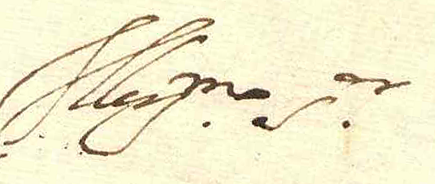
Jllus.mo s.or
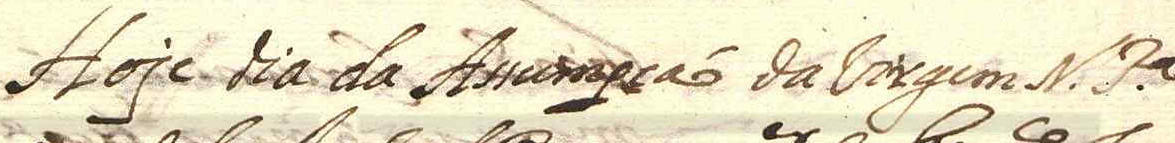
Hoje dia da Assumpçaõ da Virgem N. S.ra
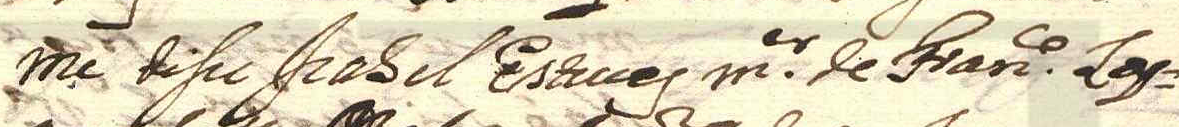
me disse Jzabel Esteues m.er de Fran.co Lop
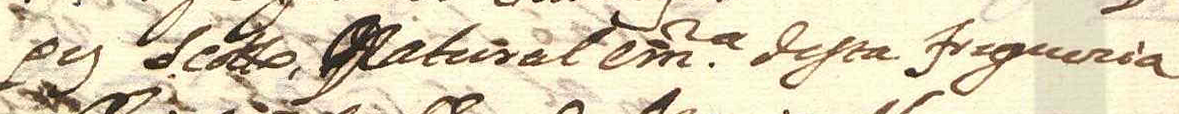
pes Scotto, Natural e m.ra desta freguezia
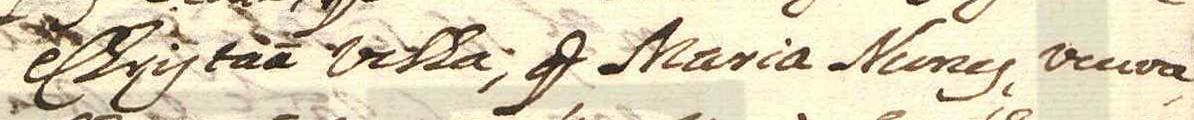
e Christaā velha; q̄ Maria Nunes, veuva
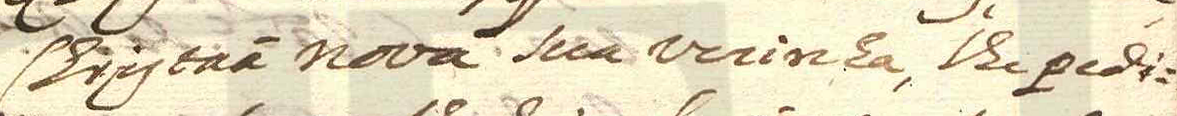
Christaā nova sua vezinha, lhe pedi
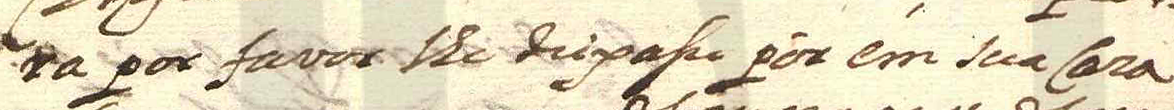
ra por favor lhe deixasse por em sua Caza
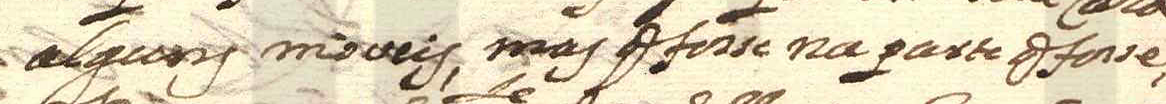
alguns moveis, mas q̄ fosse na parte q̄ fosse,
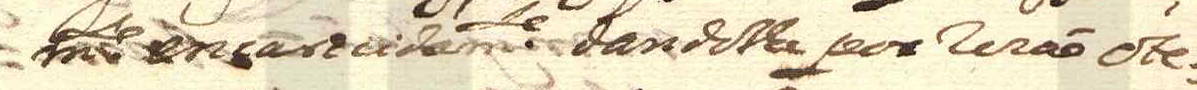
m.to encarecidam.te dandolhe por Rezaõ o te
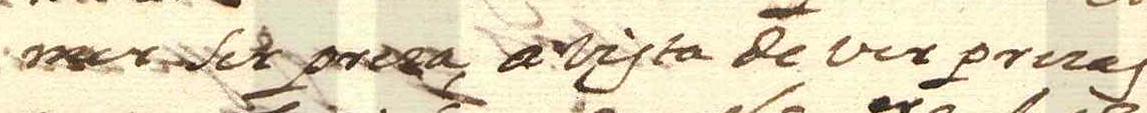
mer ser preza a vista de ver prezas
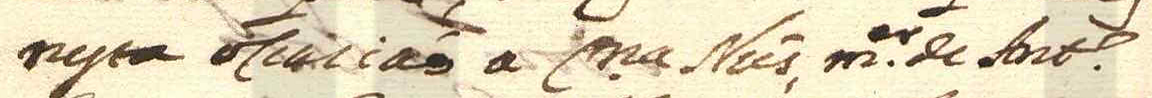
nesta oCcaziaõ a C.na Nus̄, m.er de Ant.o
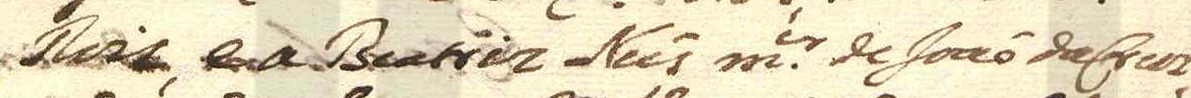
Reis, e a Beatriz Nus̄ m.er de Joaõ da Cruz
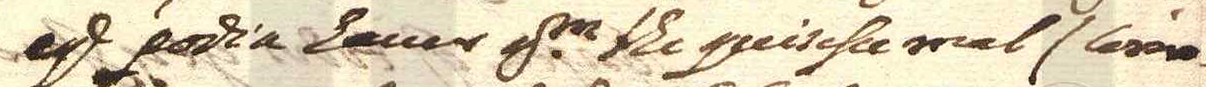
e q̄ podia hauer q.m lhe quisesse mal (como
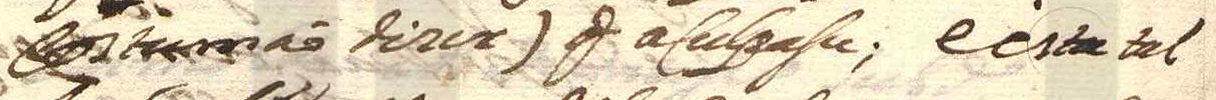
Costumaõ dizer) q̄ a Culpasse; e esta tal
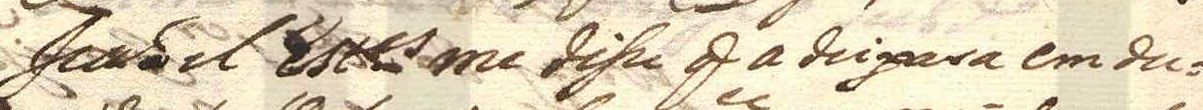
Jzabel Est.es me disse q̄ a deixara em du
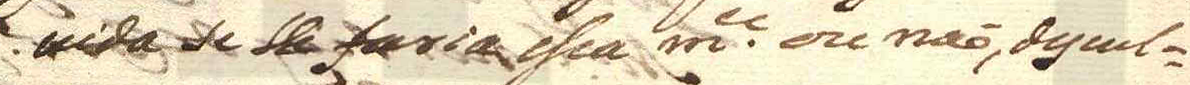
uida se lhe faria essa m.ce ou naõ, descul
